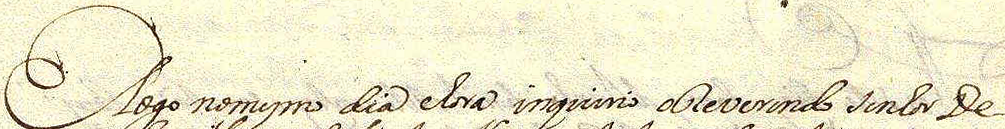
E Logo no mesmo dia e hora inquirio o Reverendo senhor De
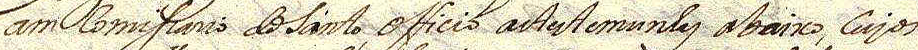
am Commissario do Santo Officio as testemunhas abaixo, Cujos
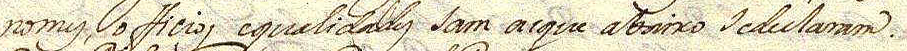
nomes, officios e qualidades sam as que abaixo se declaram.
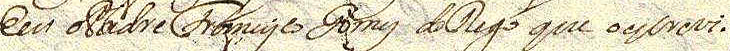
E eu o Padre Francisco Gomes do Rego que o escrevi.
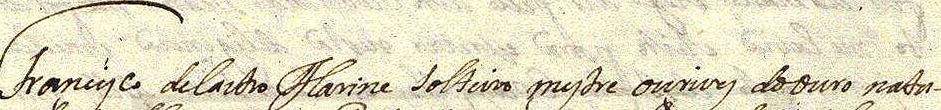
Francisco de Castro Marine Solteiro mestre ourives do ouro natu
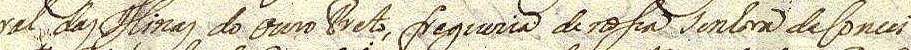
ral das Minas do Ouro Preto, freguezia de nossa senhora da Concei
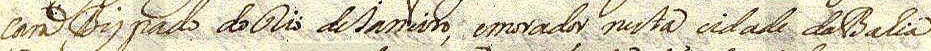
cam Bispado do Rio de Ianeiro, e morador nesta cidade da Bahia
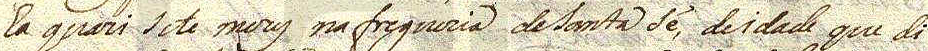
ha quazi sete mezes na freguezia de Santa Sé, de idade que di
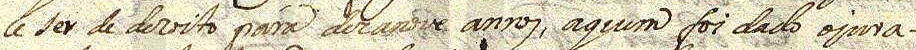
ce ser de dezoito para dezanove annos, a quem foi dado o jura
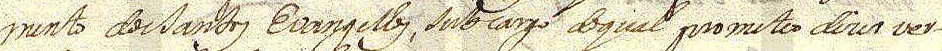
mento dos Santos Evangelhos, sub cargo do qual prometeo dizer ver
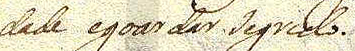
dade e goardar segredo.
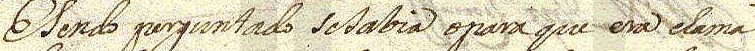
E Sendo perguntado se Sabia o para que era chama
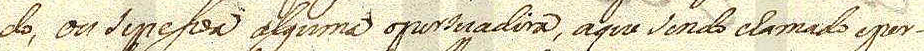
do, ou se pessoa alguma o persuadira, a que sendo chamado e per
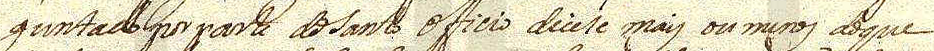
guntado por parte do Santo Officio dicese mais ou menos do que
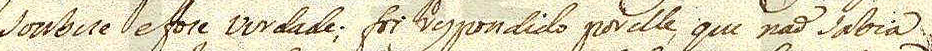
soubese e fose verdade; foi respondido por elle, que naõ sabia
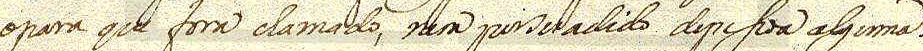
o para que fora chamado, nem persuadido de pessoa alguma.
